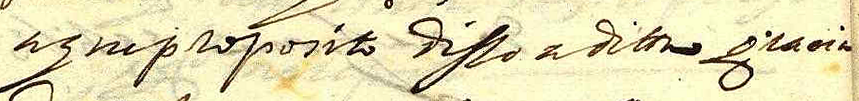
a que proposito disse a ditta gracia
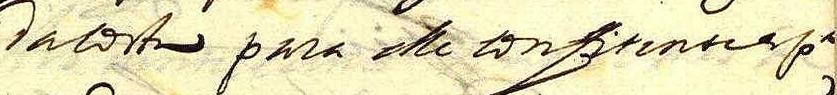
da costa para elle confitente e pa
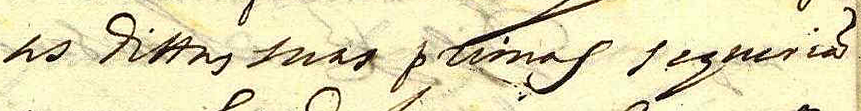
as dittas suas primas se queriaõ
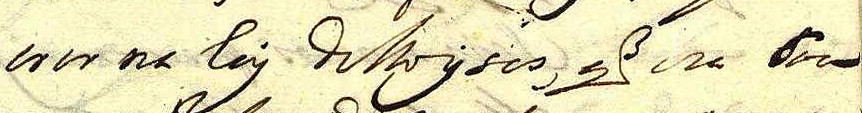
crer na ley de Moyses, q̄ era boa
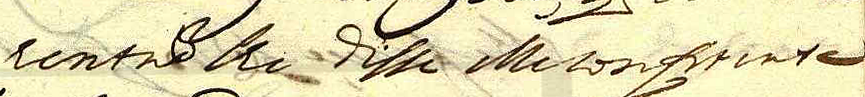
e entaõ lhe disse elle confitente
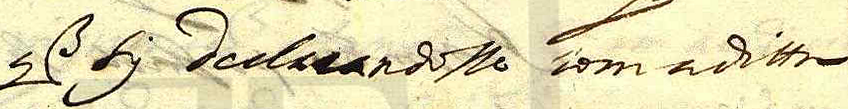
q̄ sy declarandosse com a ditta
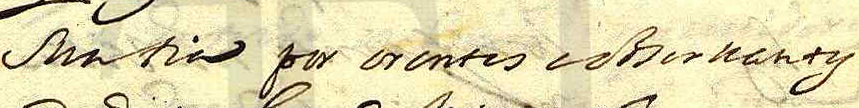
sua tia por crentes e obseruantes
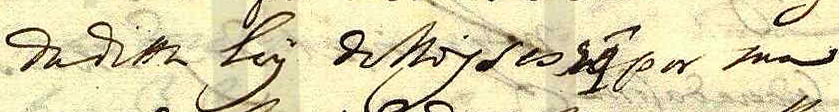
da ditta Ley de Moyses E q̄ por sua
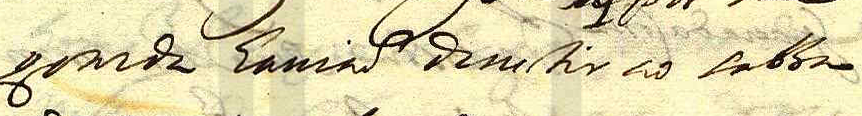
goarda hauiaõ de uestir ao sabba
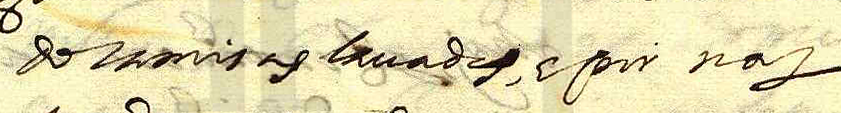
do camisas lauadas, e por nas
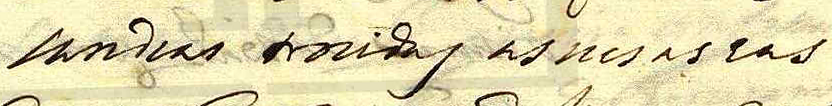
Candeas trazidas as uesas E as
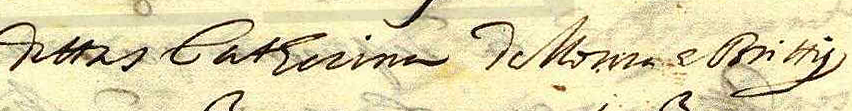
dittas Catherina de Moura e Brittis
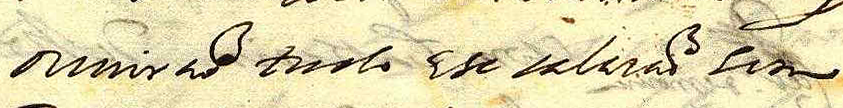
ouuiraõ tudo E se calaraõ sem
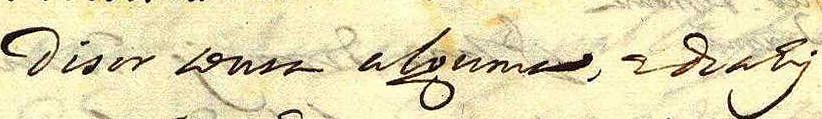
diser couza alguma, E de ahy
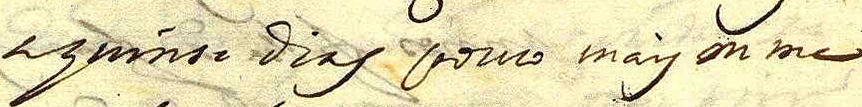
a quinse dias pouco mais ou me
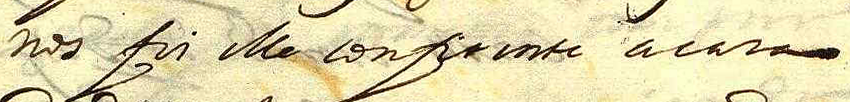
nos foi elle confitente a caza
